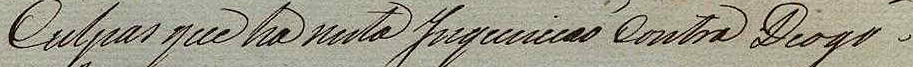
Culpas que ha nesta Jnquisicaõ Contra Diogo
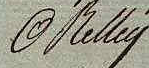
ORelley
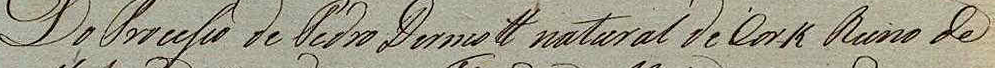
Do Processo de Pedro Dermes tt natural de Cork Reino de
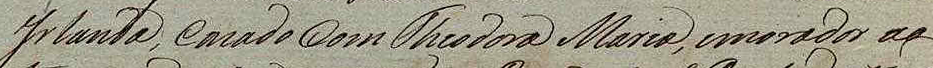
Jrlanda, cazado Com Theodora Maria, e morador ao
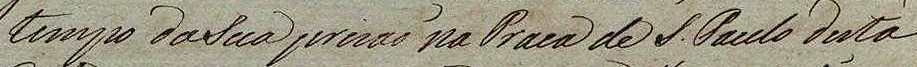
tempo da Sua prisaõ na Praca de S. Paulo desta
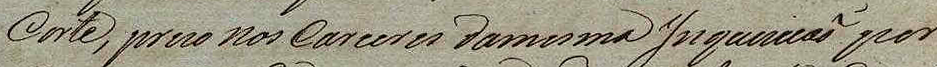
Corte, preso nos Carceres da mesma Jnquisicaõ por
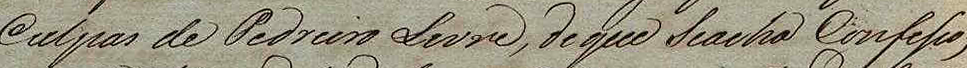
Culpas de Pedreiro Livre, de que Seacha Confesso,
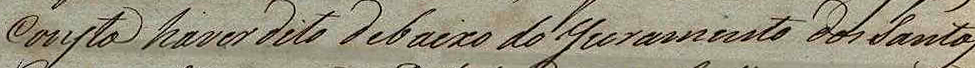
Consta haver dito debaixo do Juramento dos Santos
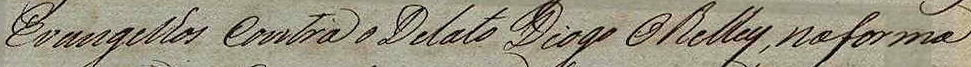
Evangelhos Contra o Delato Diogo ORelley, na forma
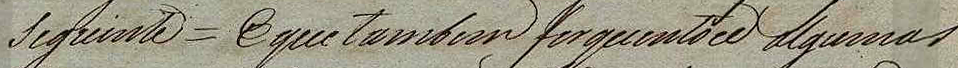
seguinte = E que tambem ferquentou algumas
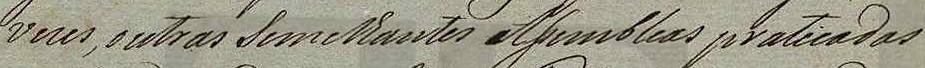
veses, outras Semelhantes Assembleas praticadas
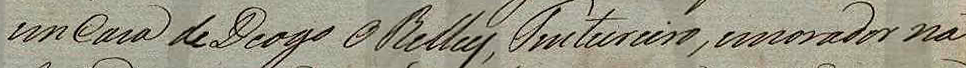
em Caza de Deogo O Relley, Tentureiro, e morador na
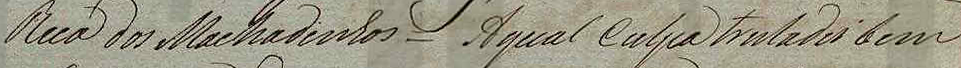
Rua dos Machadinhos= A qual Culpa tresladei bem
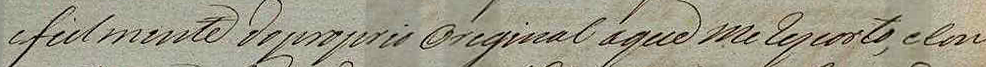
e fielmente do proprio oreginal a que me Reporto, e con
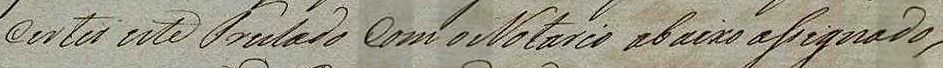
certei este Treslado Com o Notario abaixo assignado,
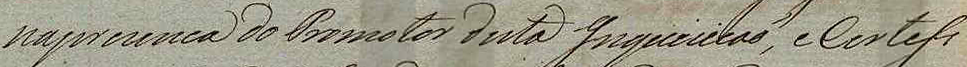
na prezenca do Promotor desta Jnquisicaõ, e Certefi
